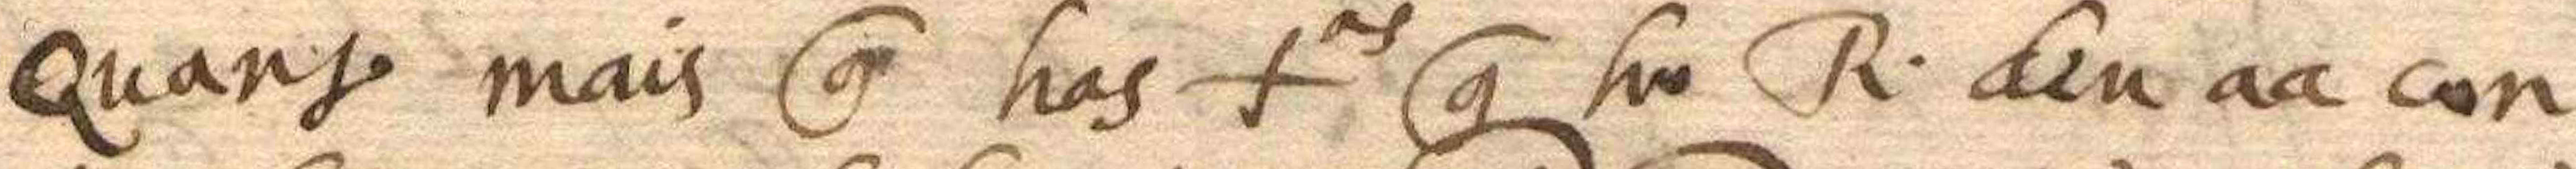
Quanto mais q̄ has tas q̄ ho R. deu aa con
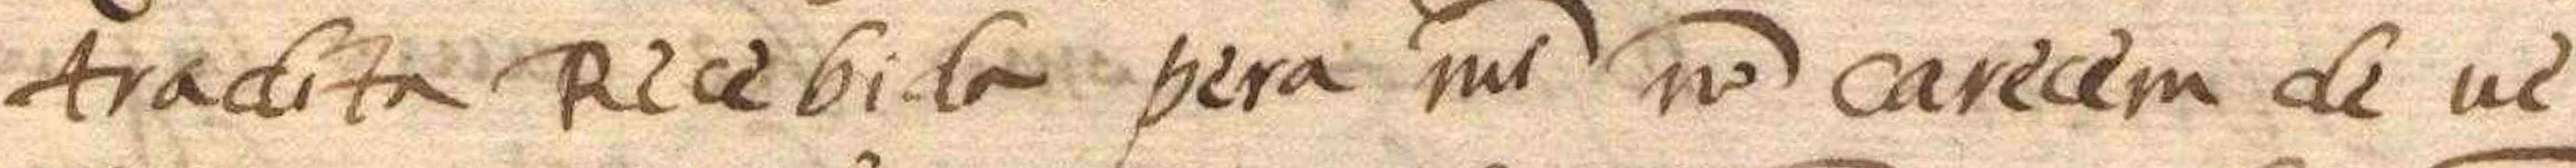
tradita Recebida pera m̄i n̄o carecem de ue
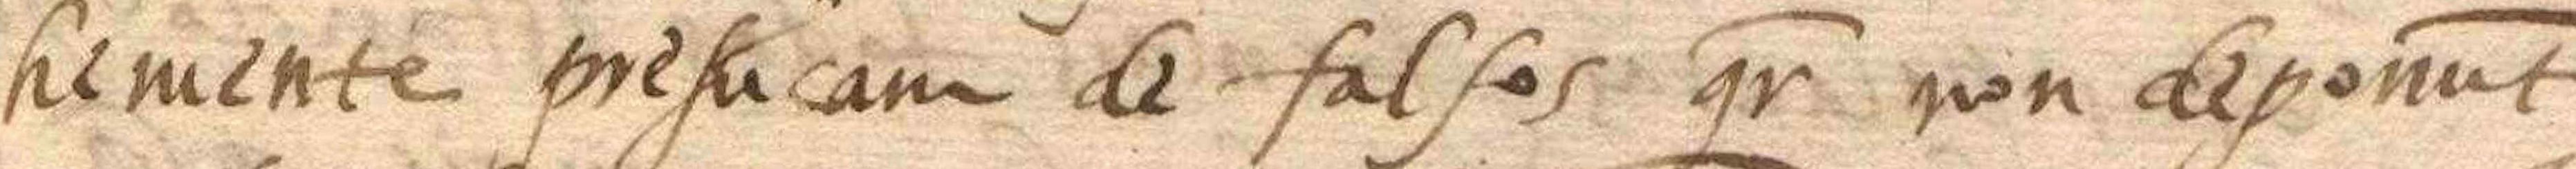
hemente presūcam de falsos q̄r non depon̄ut
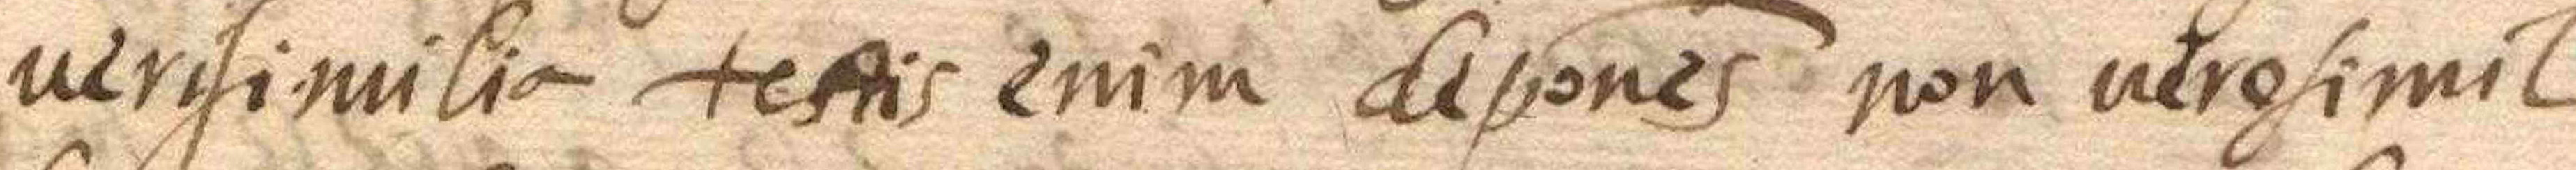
uerisimilia testis enim depōnes non uerosimil
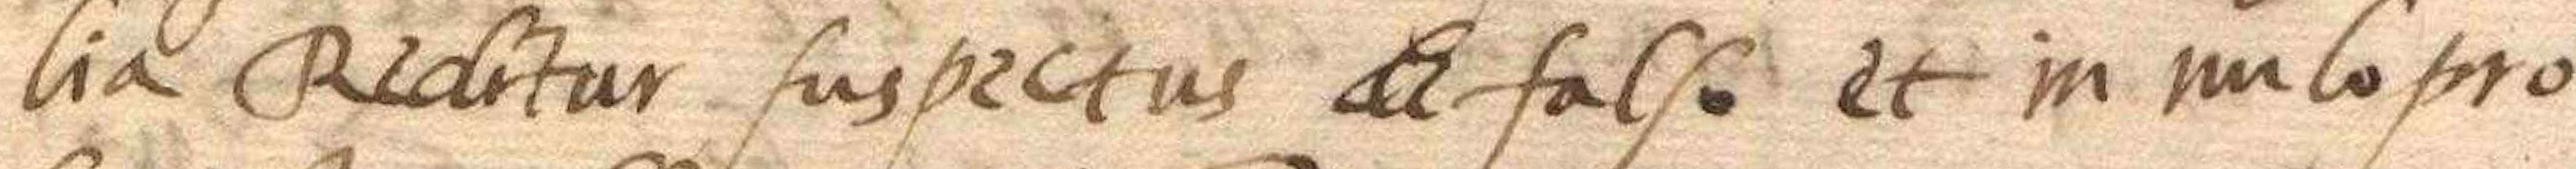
lia Reditur suspectus de falso et in nulo pro
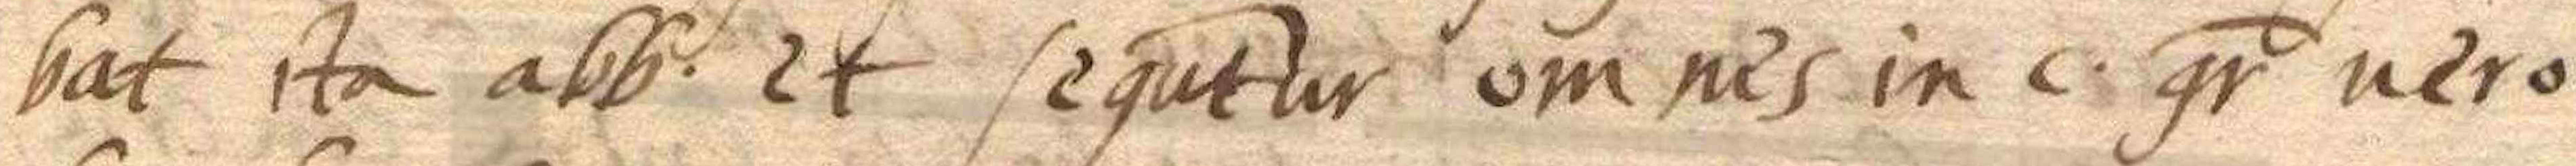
bat ita abb. et seq̄utur omnes in c. q̄r uero
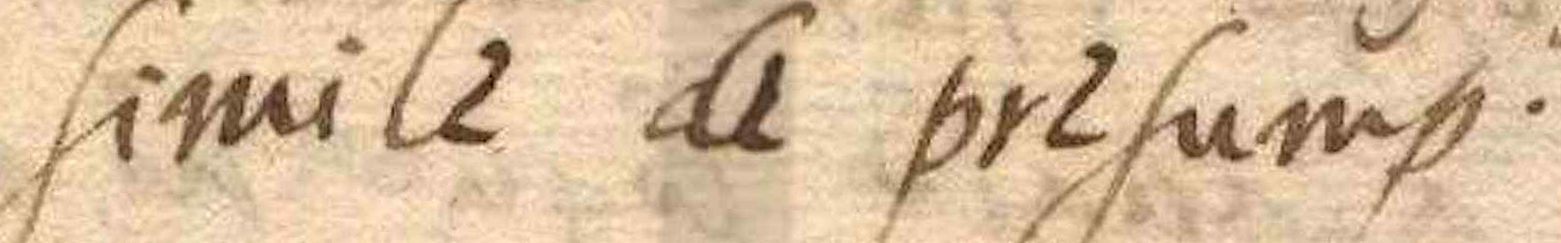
simile de presump.
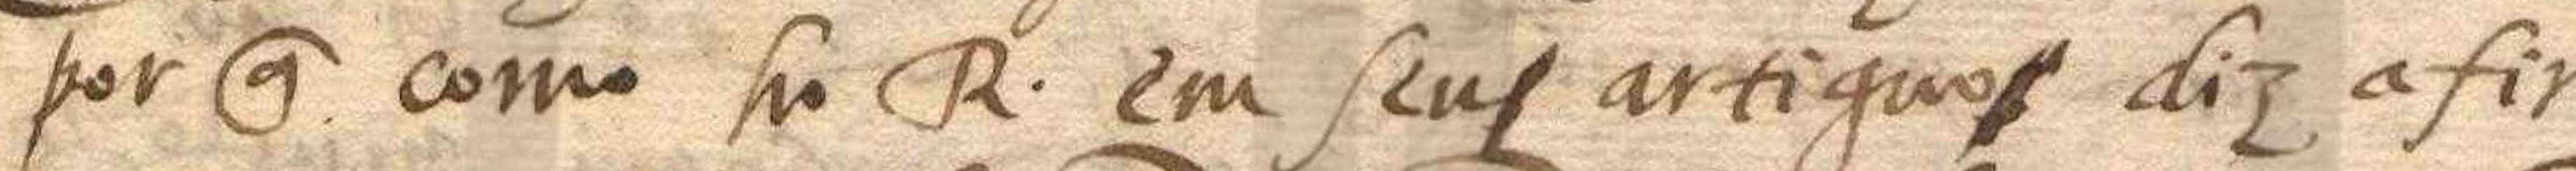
por q̄ como ho R. em seu_ artiguo_ diz afir
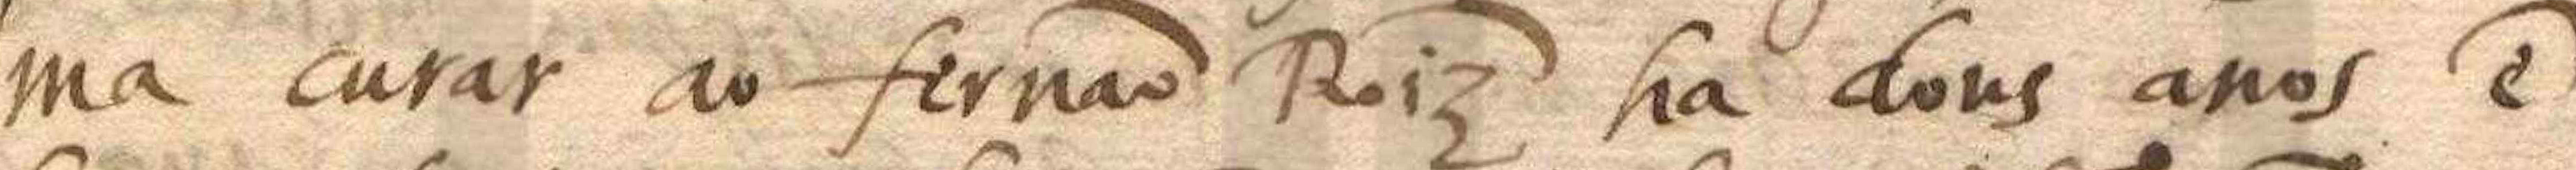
ma curar ao fernão Rōiz ha dous anos ē
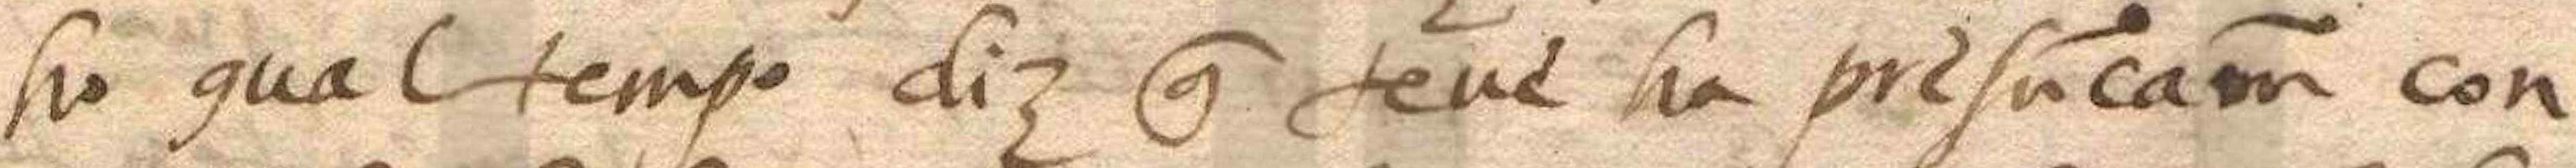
ho qual tempo diz q̄ teue ha presūcam con
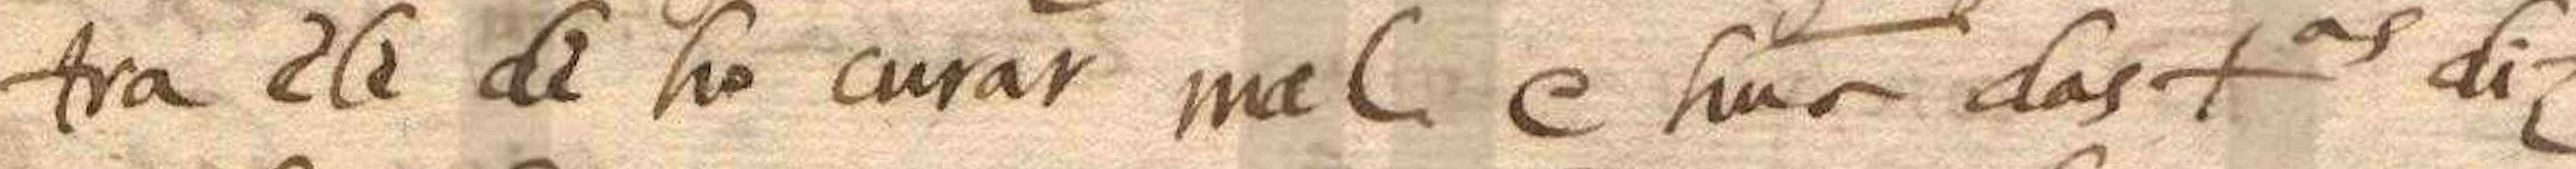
tra ele de ho curar mal e hūa das tas diz
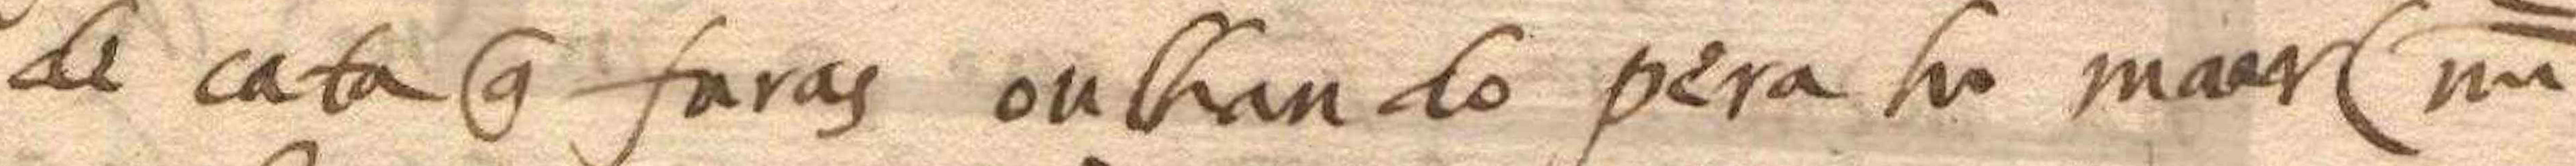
de cata q̄ faras oulhando pera ho maar (nū
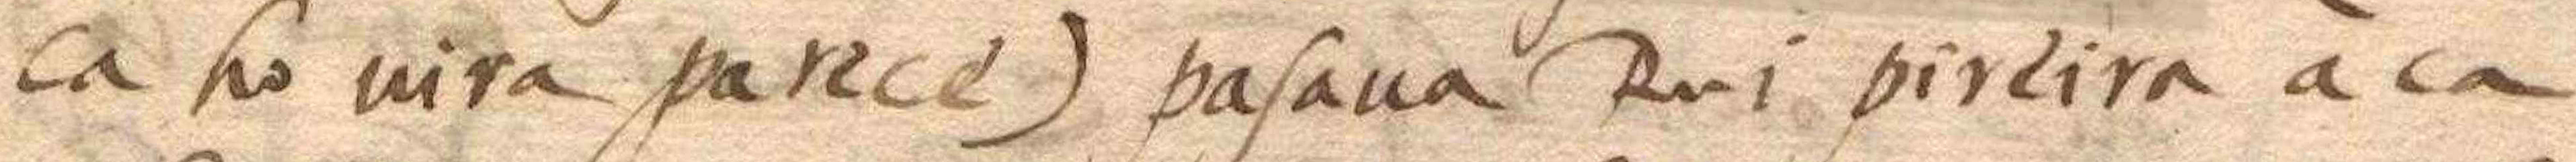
ca ho uira parece) pasaua Rui pireira a ca
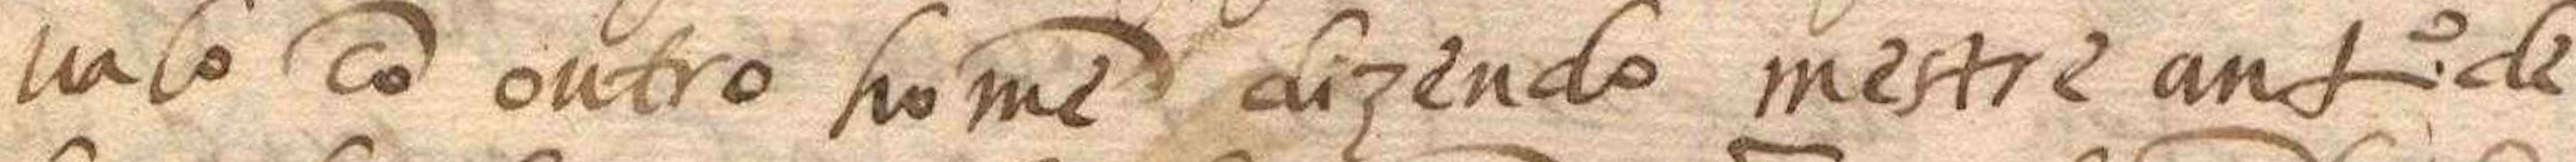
ualo c̄o outro hom̄e dizendo mestre anto de
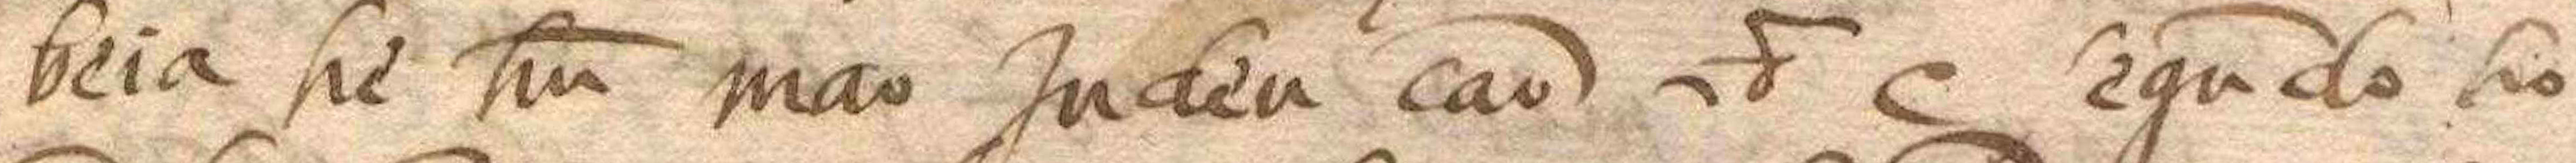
beia he hū mao Judeu cão ct̄ e segūdo ho
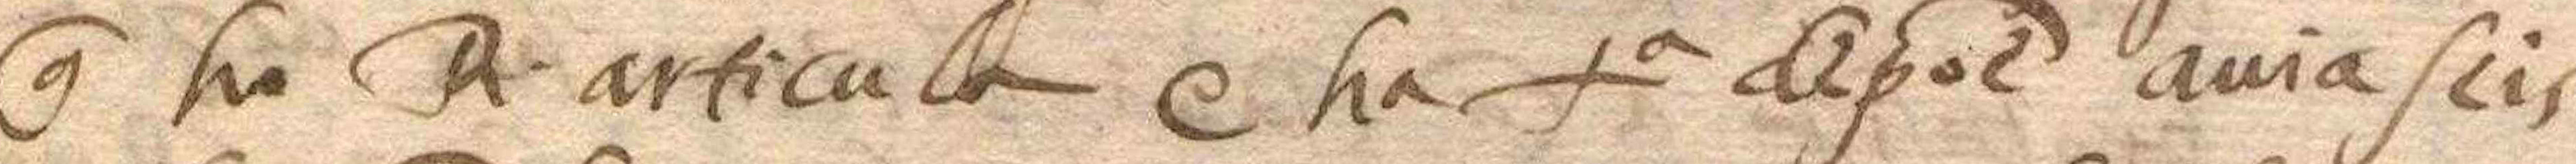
q̄ ho R. articula e ha ta depõe auia seis
